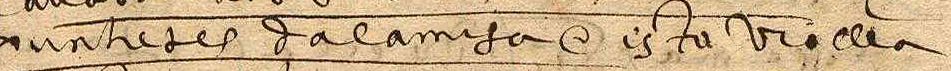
punhetes da camisa e isto vio ella
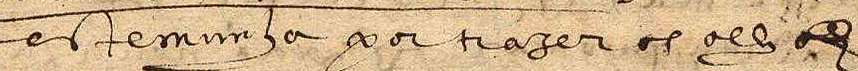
testemunha por trazer os olhos
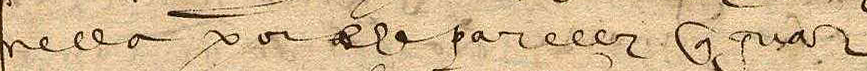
nella por lhe parecer q̄ guar
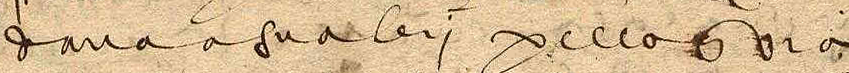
daua a sua ley pello q̄ via
